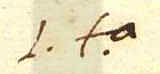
1. t.a
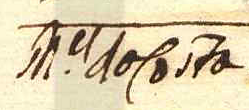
M.el da Costa
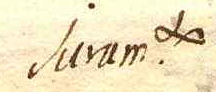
Iuram.to
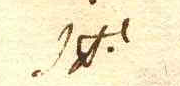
Id̄.e
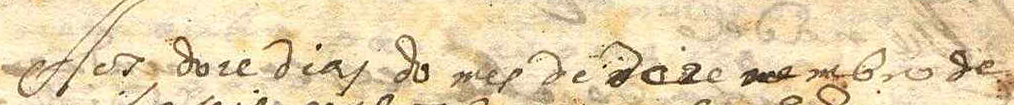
Aos doze dias do mes de dezemembro de
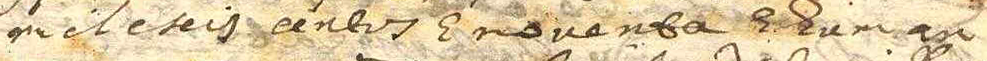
mil e seiscentos E nouenta E hum an
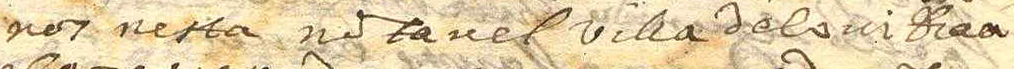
nos nesta notauel villa de couilhaã
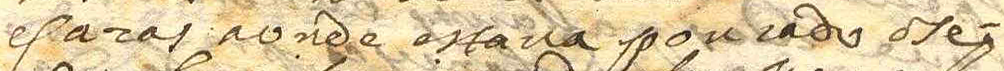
e Cazas aonde estaua pouzado o se
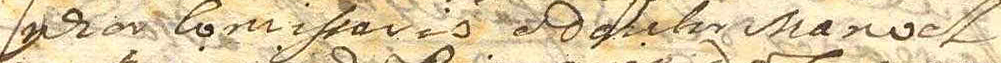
nhor comissario o doutor Manoel
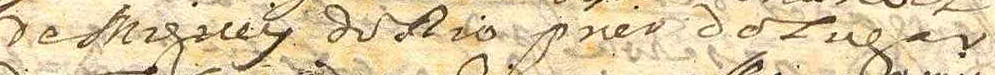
de Migueis do Rio prior do Lugar
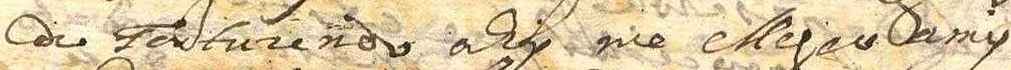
de Tortuzendo ahy me ellegeo a my
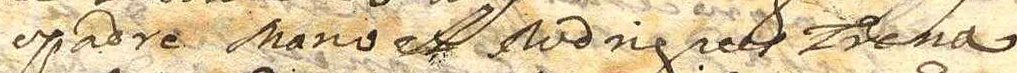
o padre Manoel Rodrigues Trena
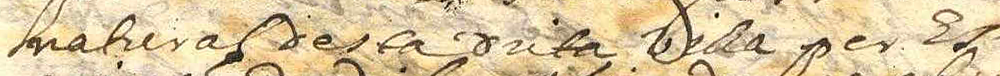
natural desta dita villa per Es
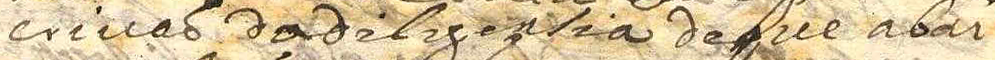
criuaõ da diligensia de que abai
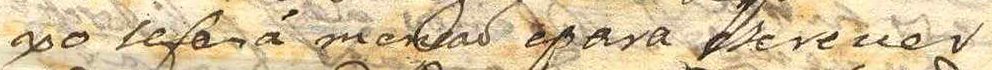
xo se fará mençaõ e para escreuer
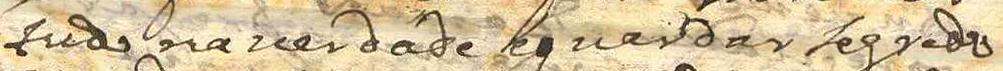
tudo na uerdade e guardar segredo
